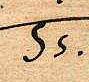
S̄s.
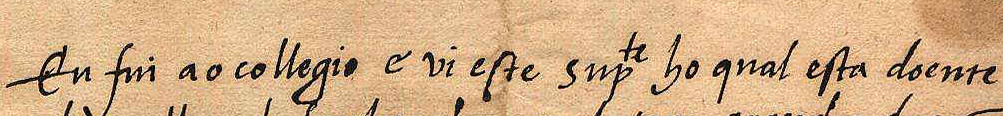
Eu fui ao collegio e vi este supte ho qual esta doente
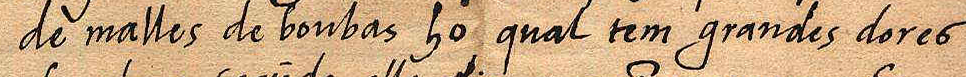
de malles de boubas ho qual tem grandes dores
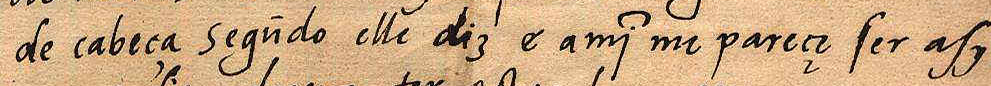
de cabeça segūdo elle diz e a mj̄ me parece ser asy
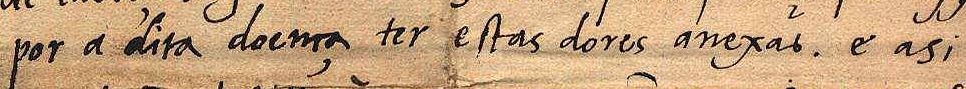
por a dita doença ter estas dores anexas. e asi
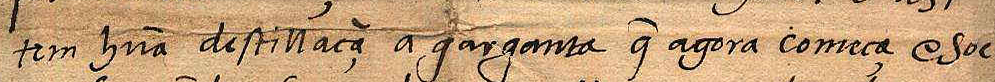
tem huā destillaçā a garganta q̄ agora começa e soo
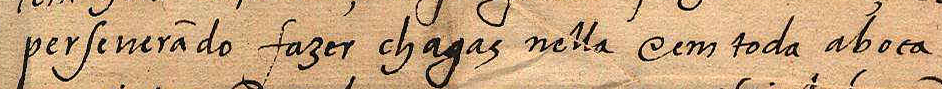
perseuerādo fazer chagas nella e em toda a boca
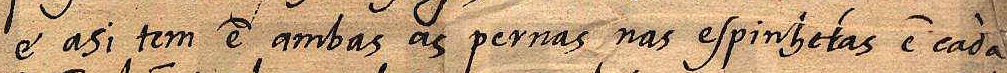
e asi tem ē ambas as pernas nas espinhetas ē cada
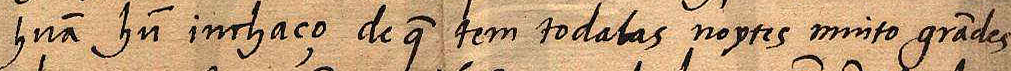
huā hū inchaço de q̄ tem todalas noytes muito grādes
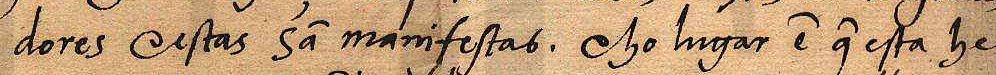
dores e estas Sā manifestas. e ho lugar ē q̄ esta he
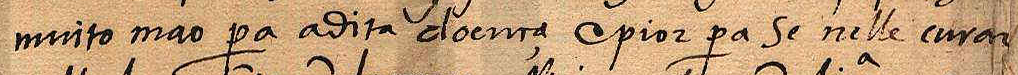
muito mao ꝑa a dita doença e pior ꝑa se nelle curar
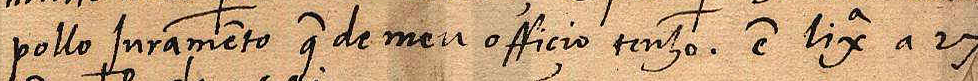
pollo Juramēto q̄ de meu officio tenho. ē lixa a 27
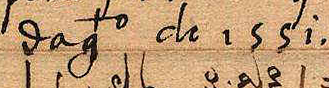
dagto de 1551.
